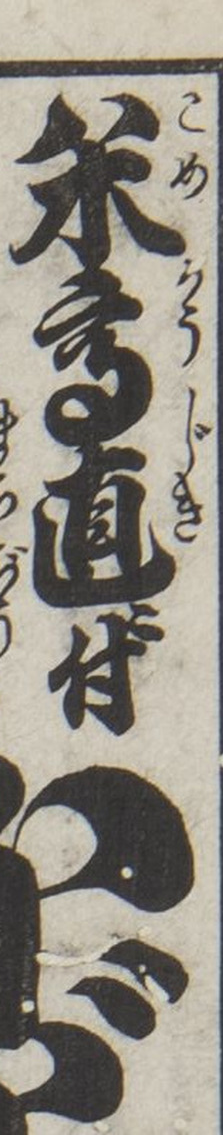米高直に付
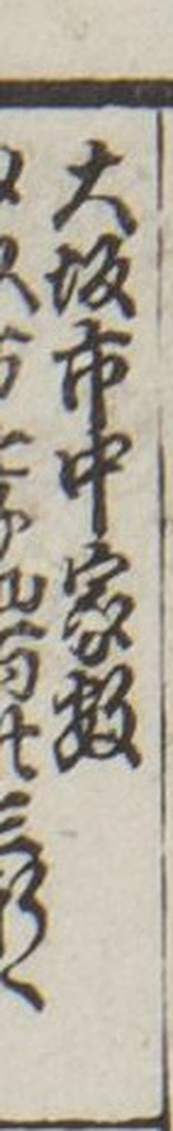大坂市中家数
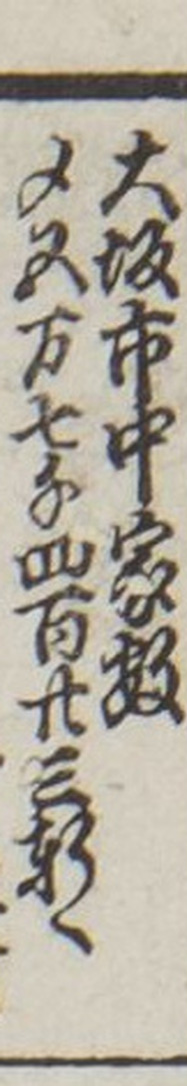〆五万七千四百廿三軒へ
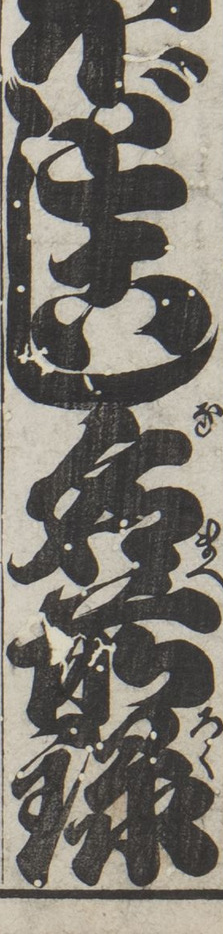ほどこし名前録
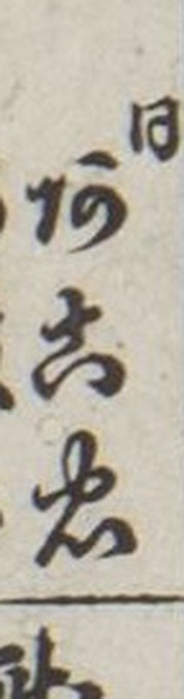あこ忠
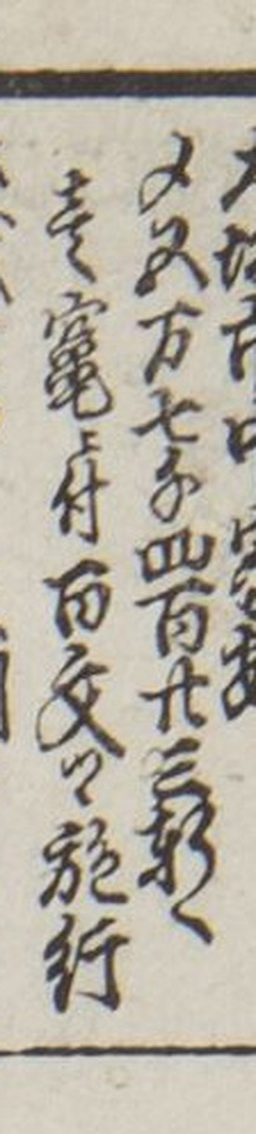壱竈ニ付百文ツヽ施行
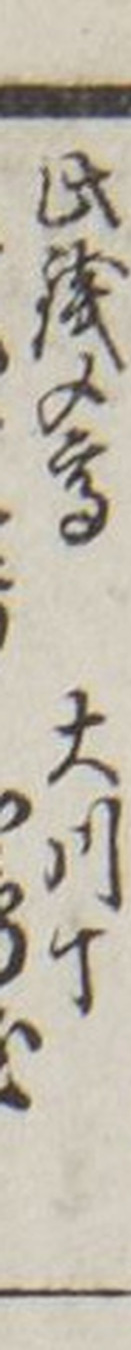此銭〆高大川町
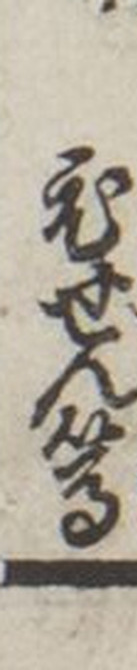ひぜん篤
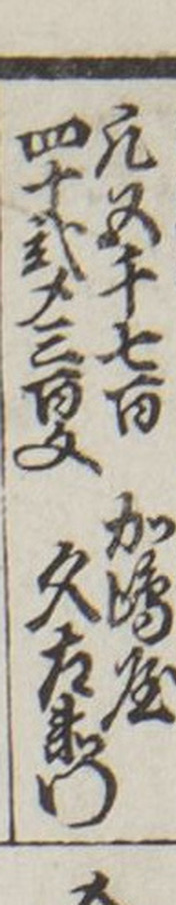四十弐貫三百文久左衛門
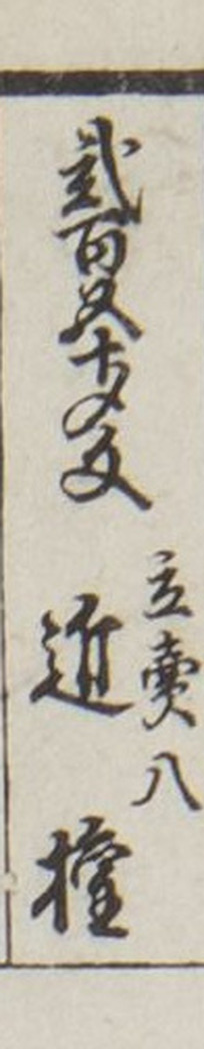弐百五十貫文近権
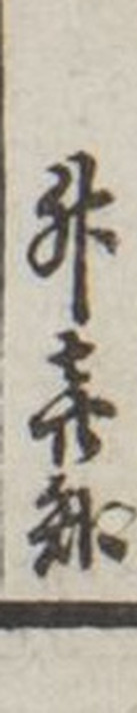升喜知
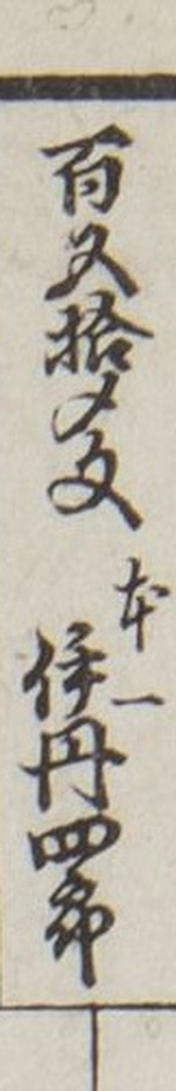百五拾貫文伊丹四郎
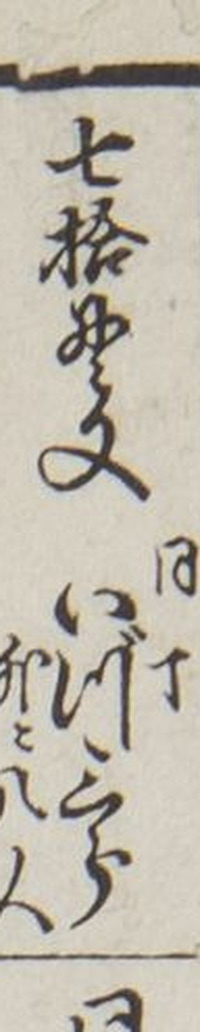七拾貫文いづ三郎
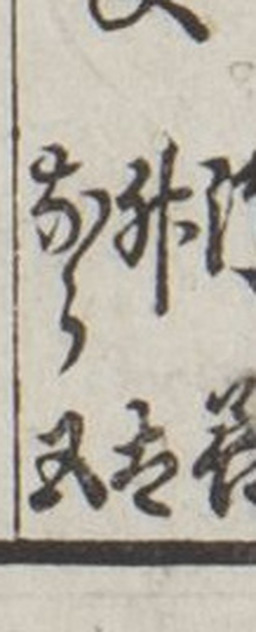なら五
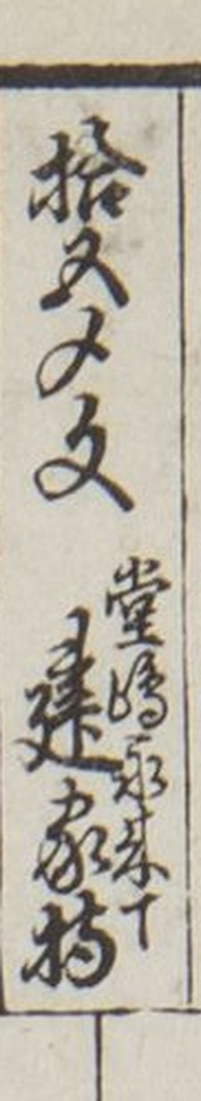拾五貫文建家持
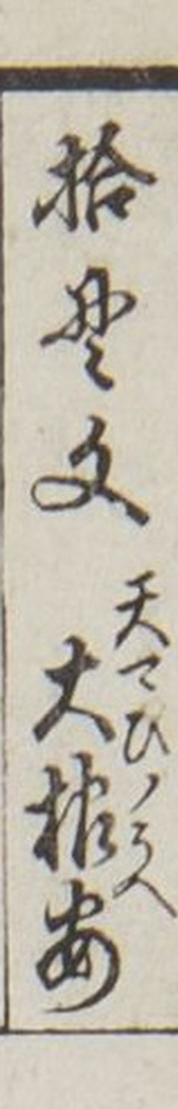拾貫文大根安
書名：米高直ニ付大阪市中にほどこし名前録後編
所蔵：あいおいニッセイ同和損保株式会社
